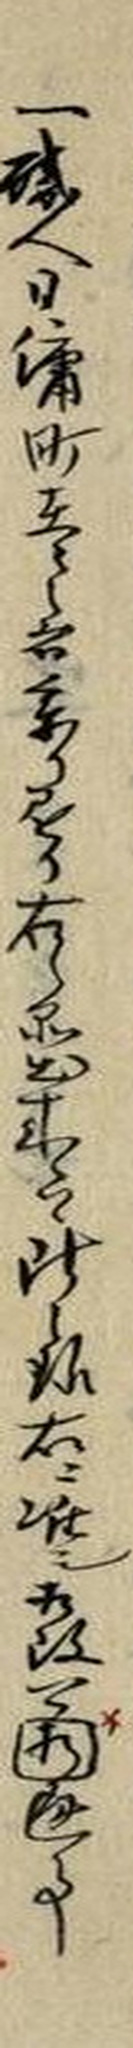一職人日傭町在々之者参り懸り右之品出来候ハヽ断之趣右ニ准し相改可相通事
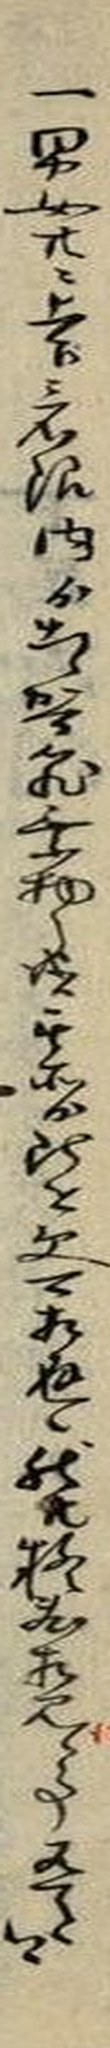一男女共ニ上下ニ不限内ゟ出候駕籠乗物之儀其所ゟ断を受可相通候然共疑敷相見得候事有之候ハヽ
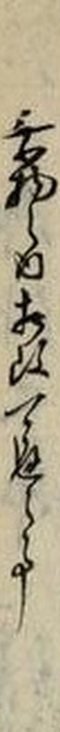乗物之内相改可通之事
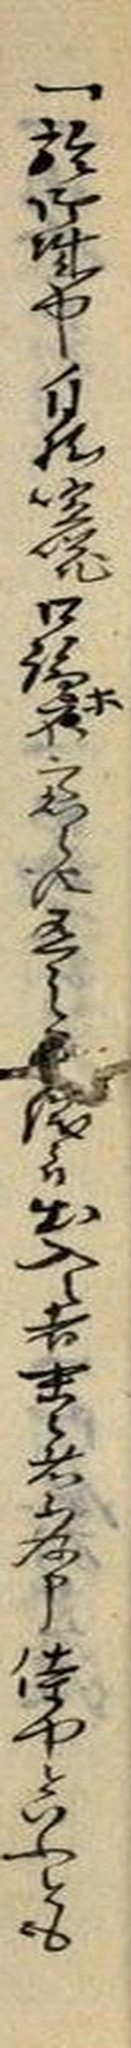一於御城中自然喧嘩口論等不慮之儀有之候儀ニ付出入之者末々は不及申侍中といふとも
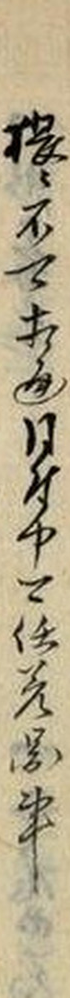猥ニ不可相通目付中可任差図事
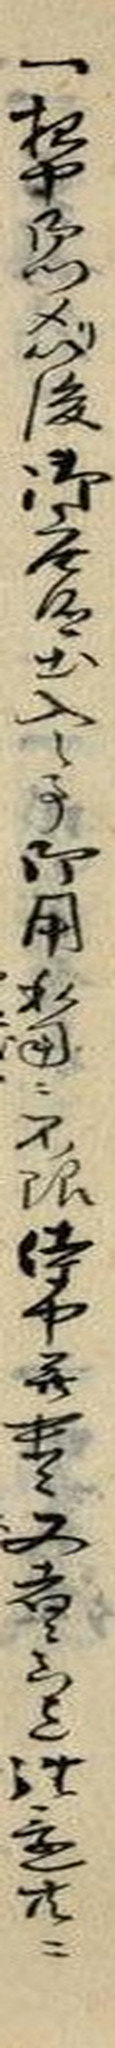一夜中御門〆り以後御座所へ出入之事御用私用ニ不限侍中并末々又者ニ至迄往還共ニ
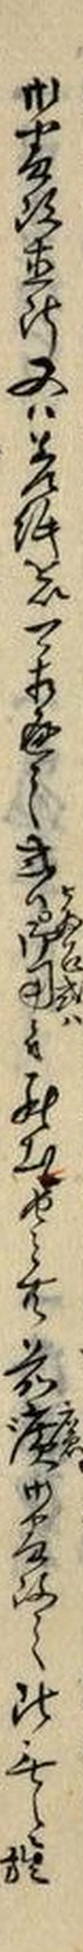御番改直断又ハ差紙を以可相通之或ハ被為召或ハ御用ニ付罷出候由ニ候共前廉御番改之断無之於
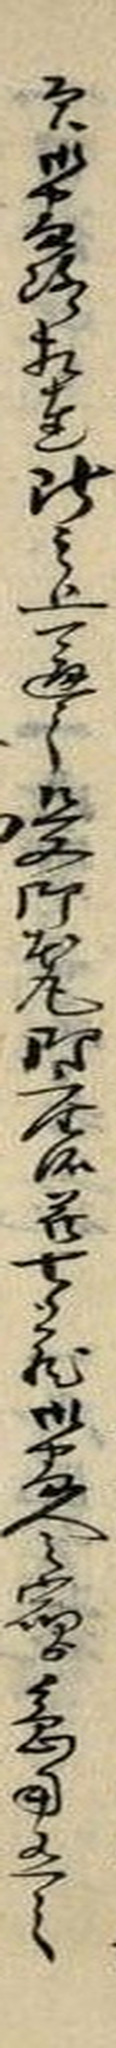而ハ御番改へ相達断之上可通之且又御本丸御座所并七ツ蔵御番人之宿ゟ急用有之
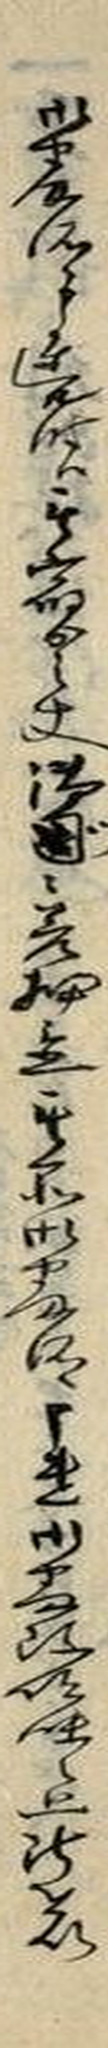御番所へ申達ル時ハ其宿ゟ之使御門ニ差押置其品御番所へ申遣御番改吟味之上断を以
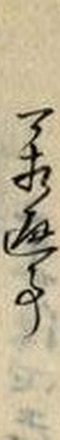可相通事
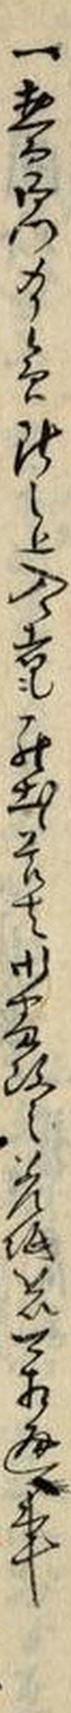一惣而御門〆り候而ハ断之上入候者も罷出候節は御番改之差紙を以可相通事
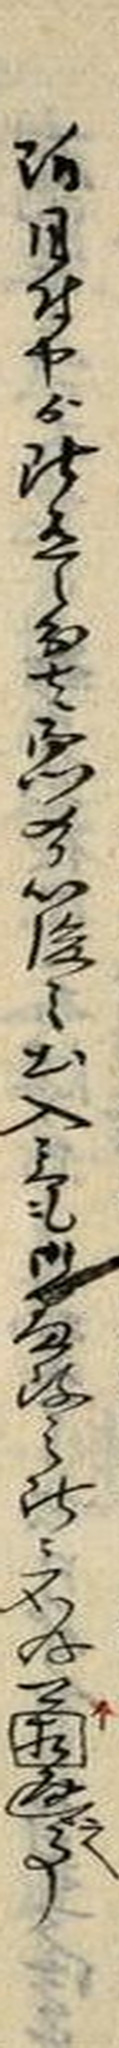附目付中ゟ断有之分は御門〆り以後之出入ニ而も御番改之断ニ不及可相通之事
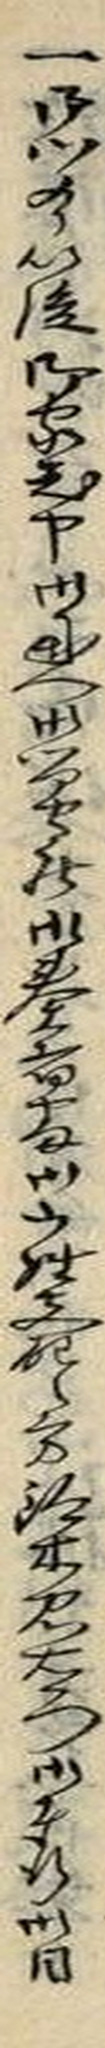一御門〆り以後御家老中御用人御留守居御奏者番御小姓支配之方鈴木忠右衛門御奉行御目
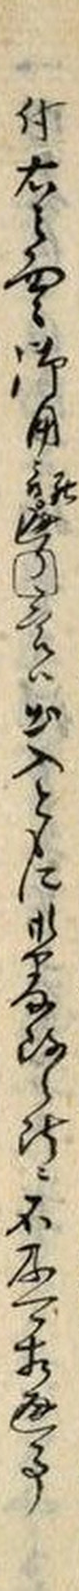付右之面々御用ニ付罷通り候節ハ出入ともに御番改之断ニ不及可相通事
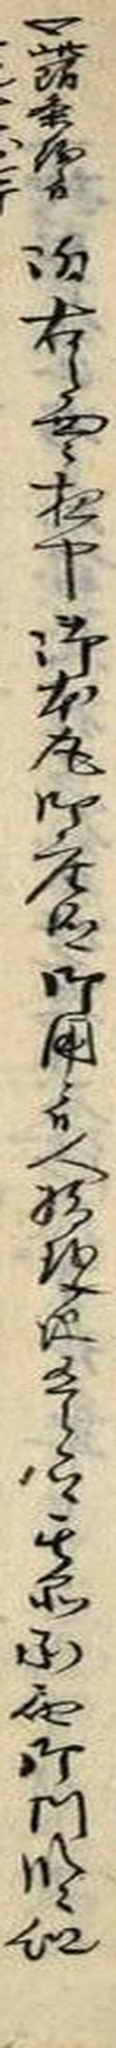附右之面々夜中御本丸御座所へ御用ニ付人指越候儀有之候ハヽ其品承届御門段々組
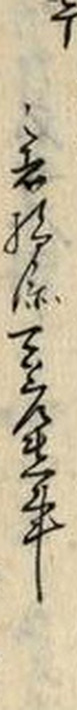之者指添可差遣事
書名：御門御櫓之部
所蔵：福井県文書館 Fukui Prefectural Archives
